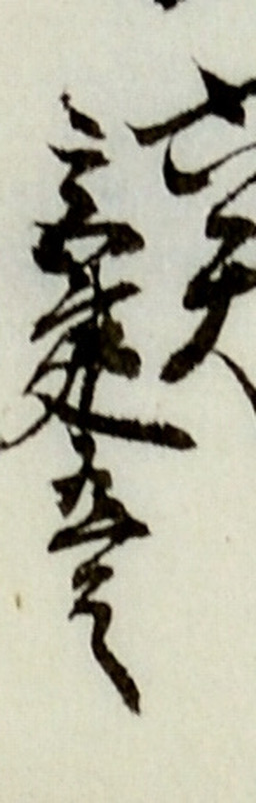宮建有之
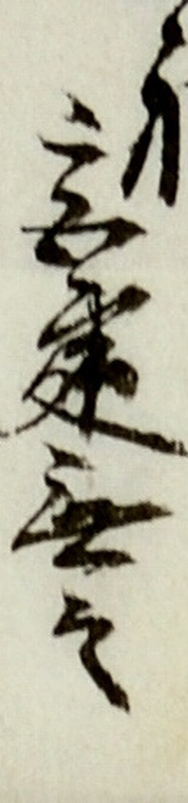宮建無之
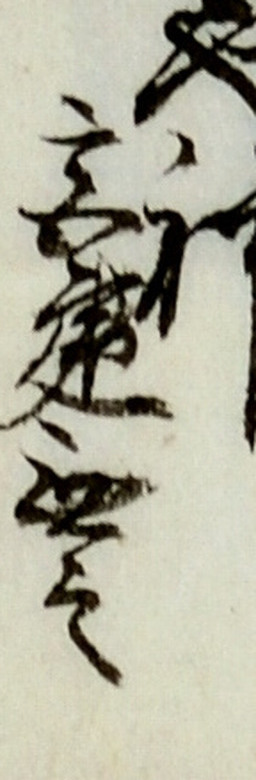宮建無之
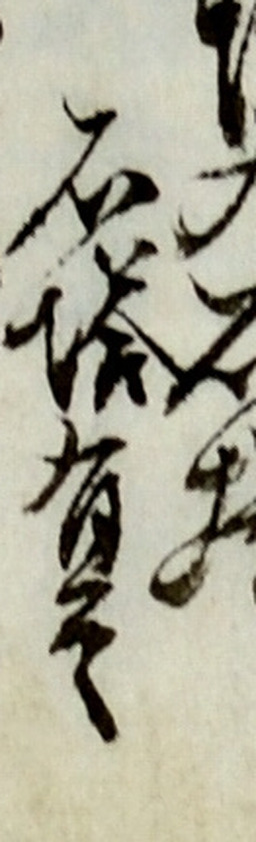石塔有之
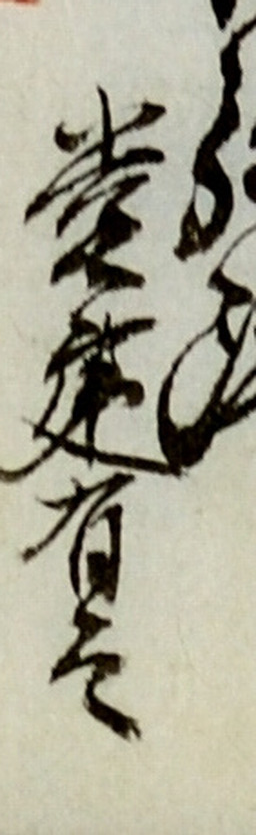堂建有之

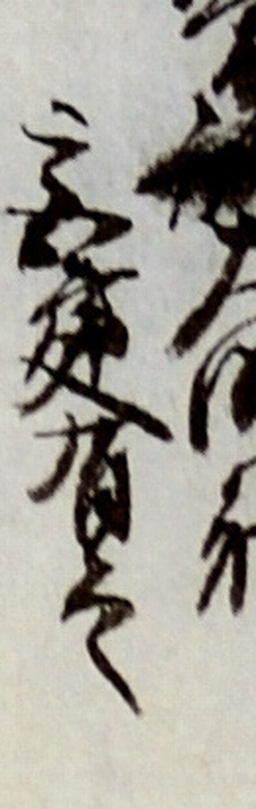宮建有之
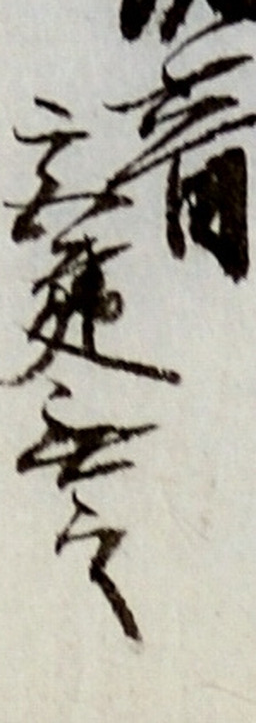宮建無之
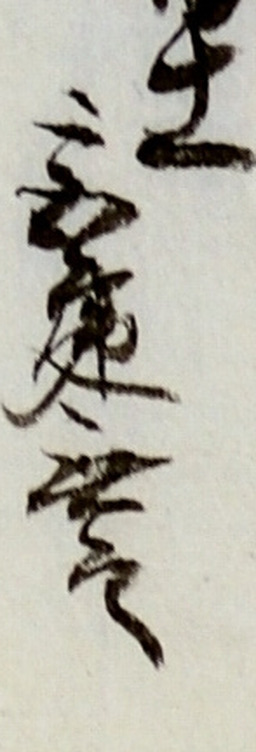宮建無之
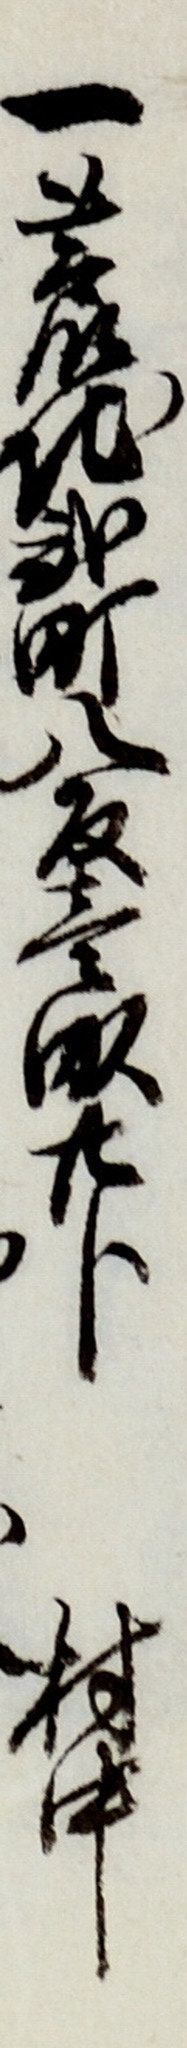一荒地弐町八反壱畝廿歩村中
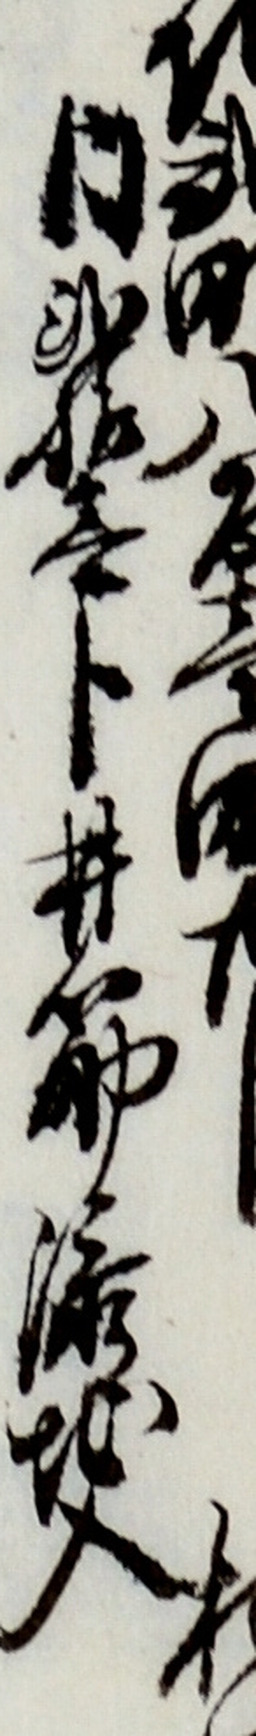内弐拾壱歩井筋添地入
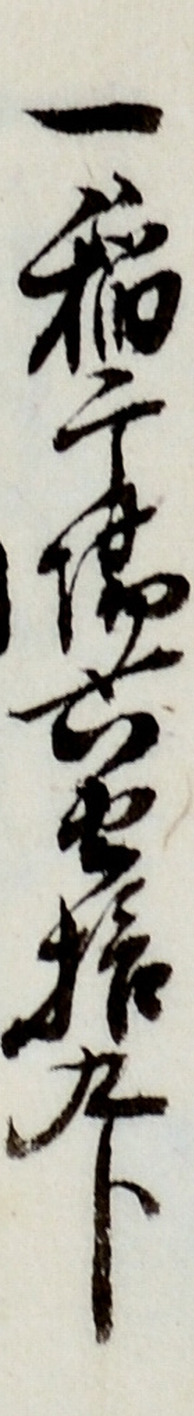一稲干場六セ拾九歩

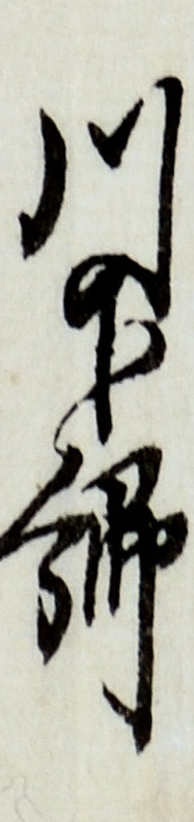川下郷
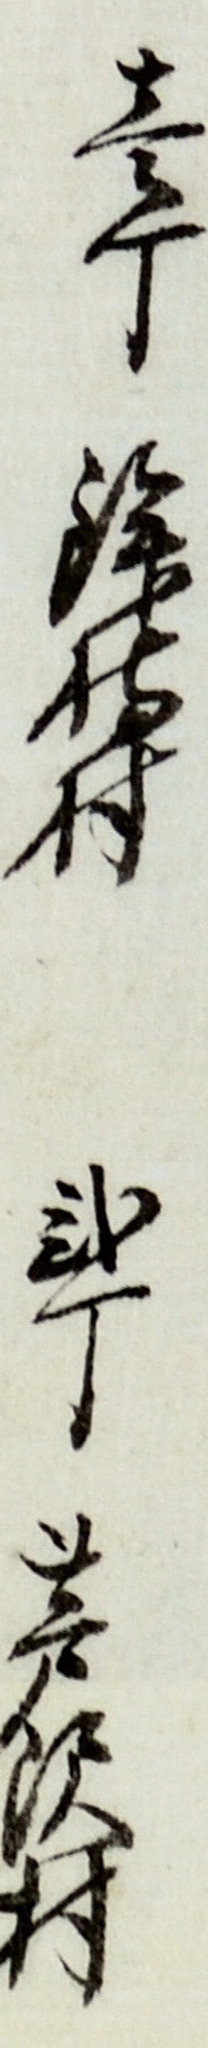壱丁鉾持村弐丁芦沢村
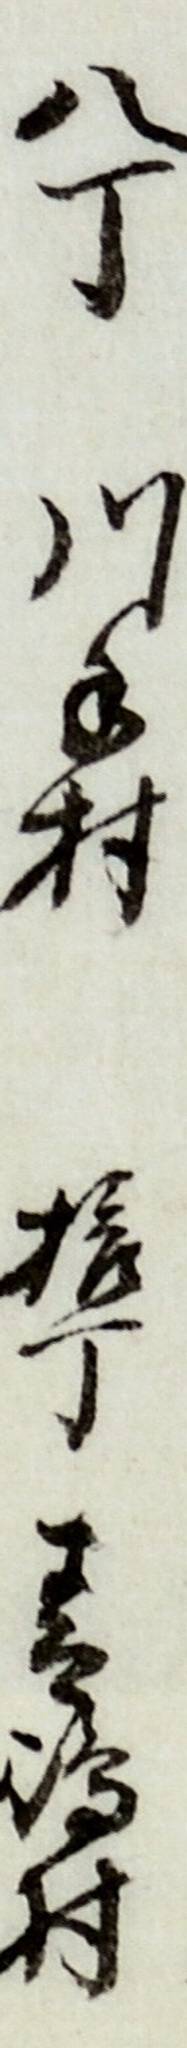八丁川手村拾丁青島村
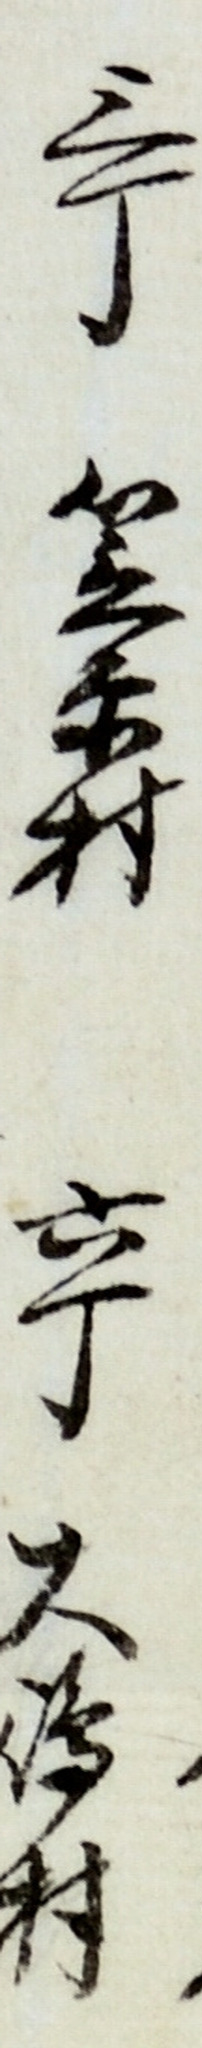三丁笠原村六丁大島村
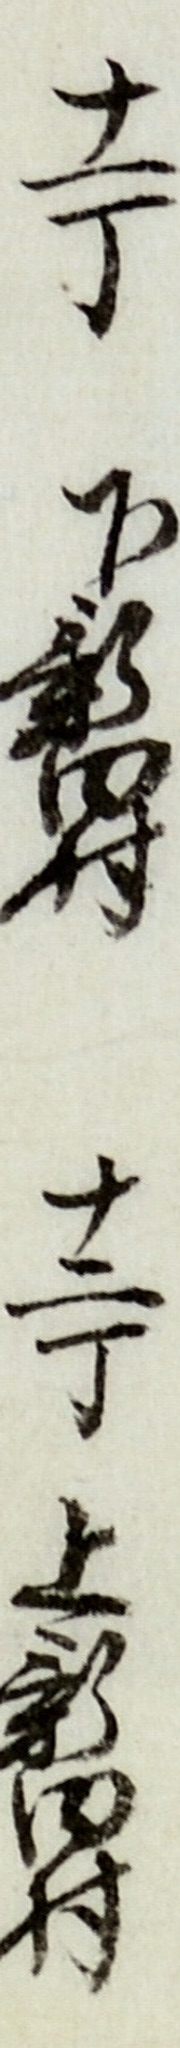十一丁下新田村十二丁上新田
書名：御領分中山林社地手控
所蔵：伊那市立高遠町図書館・合同会社AMANE
